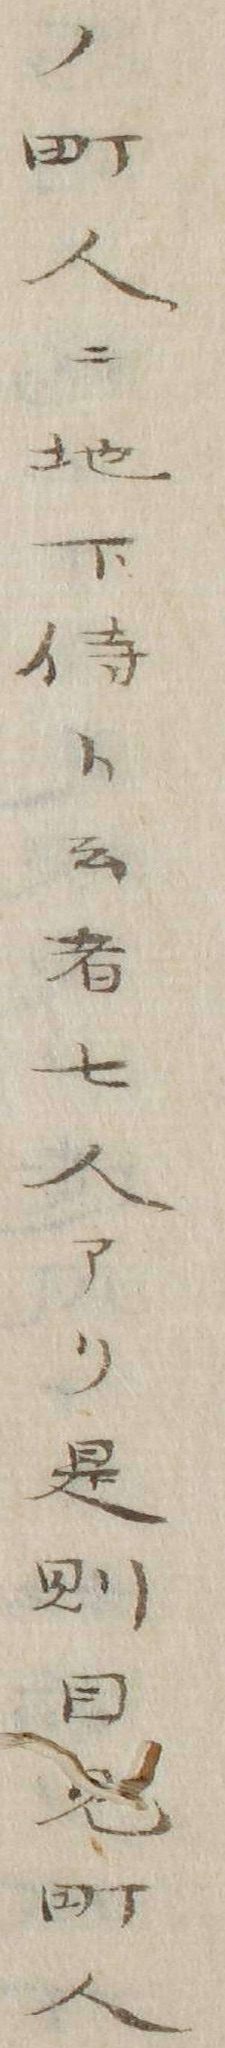ノ町人ニ地下侍ト云者七人アリ是則目見町人
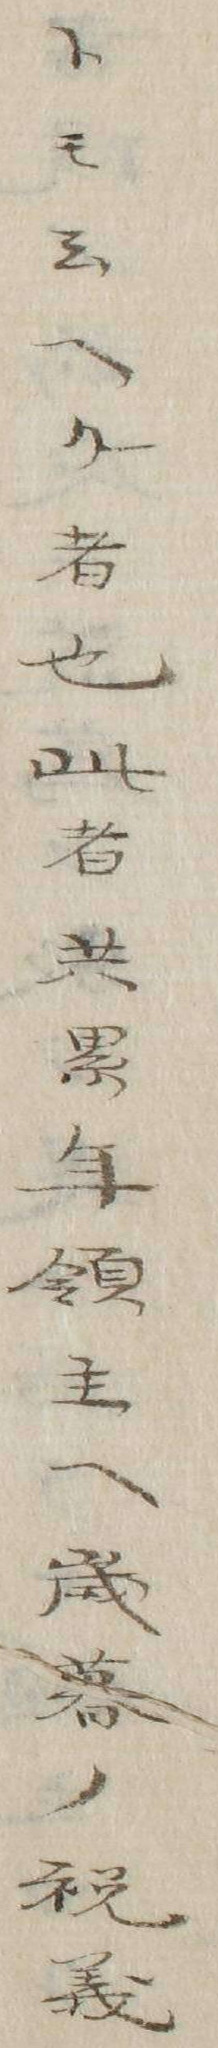トモ云ヘル者也此者共累年領主ヘ歳暮ノ祝義
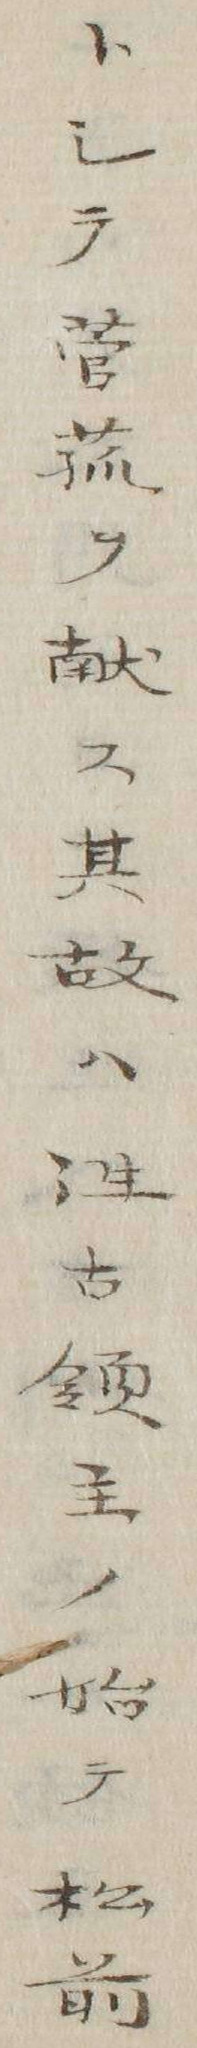トシテ菅菰ヲ献ス其故ハ往古領主ノ始テ松前
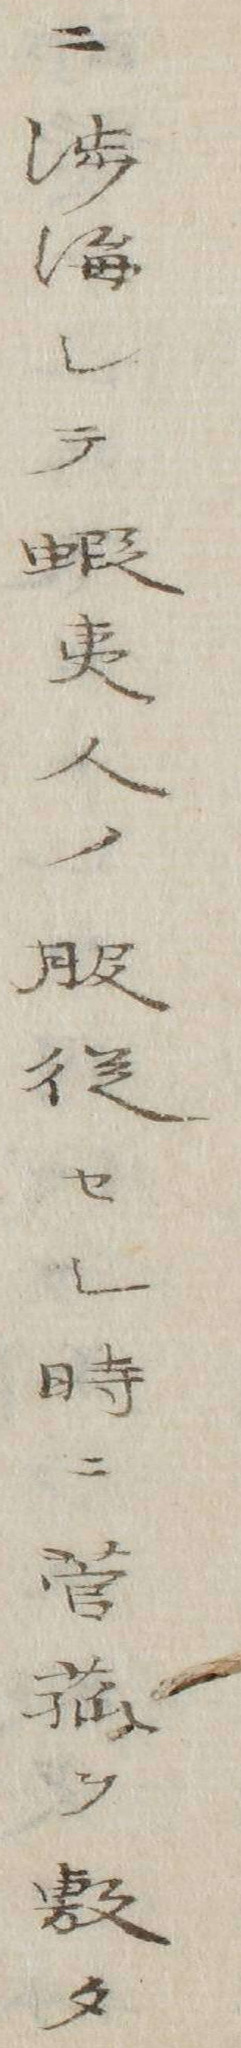ニ渉海シテ蝦夷人ノ服従セシ時ニ菅菰ヲ敷タ
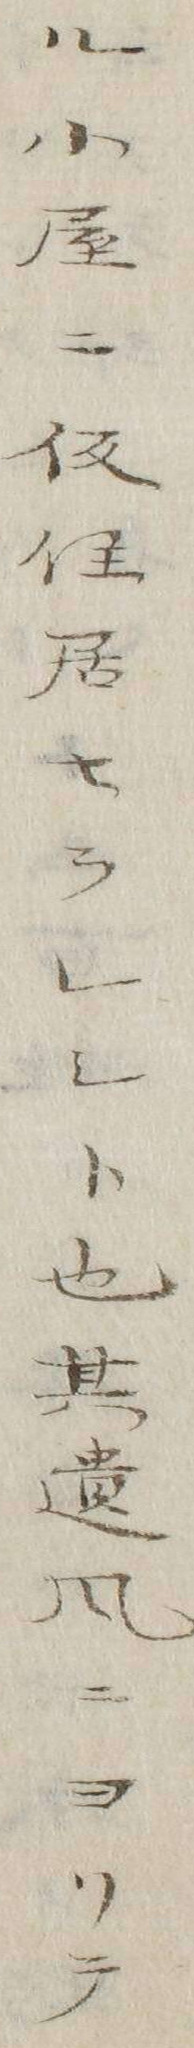ル小屋ニ仮住居セラレシト也其遺風ニヨリテ
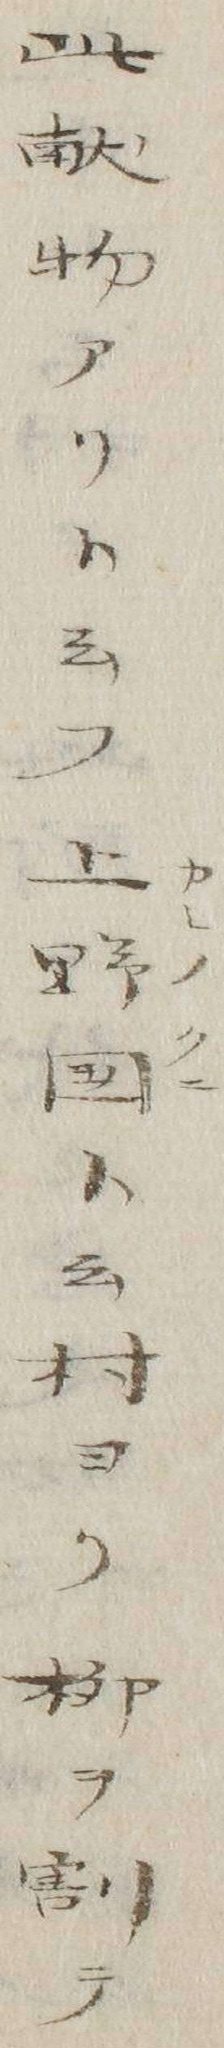此献物アリト云フ上野国ト云村ヨリ柳ヲ割テ
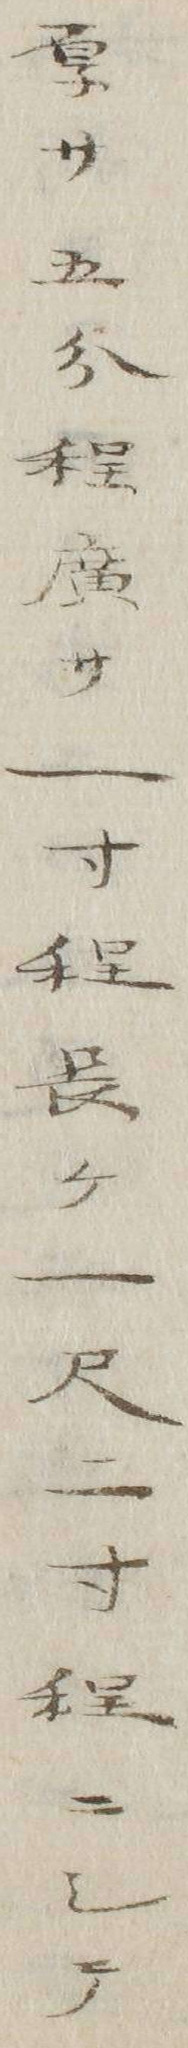厚サ五分程広サ一寸程長ケ一尺二寸程ニシテ
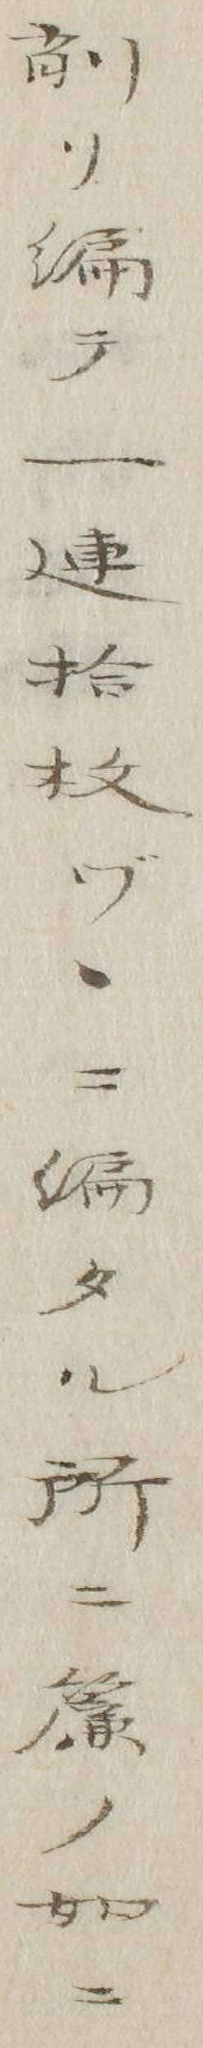削リ編テ一連拾枚ヅヽニ編タル所ニ簾ノ如ニ
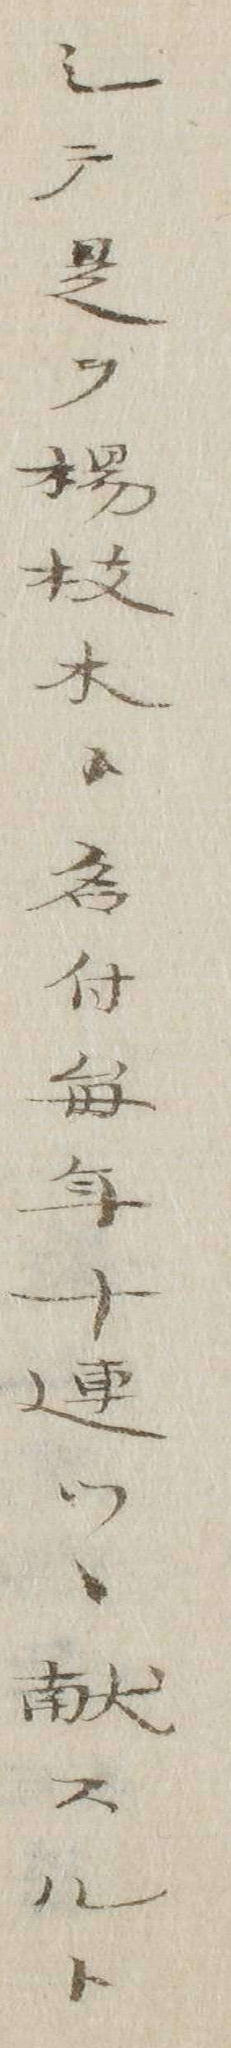シテ是ヲ楊枝木ト名付毎年十連ツヽ献スルト
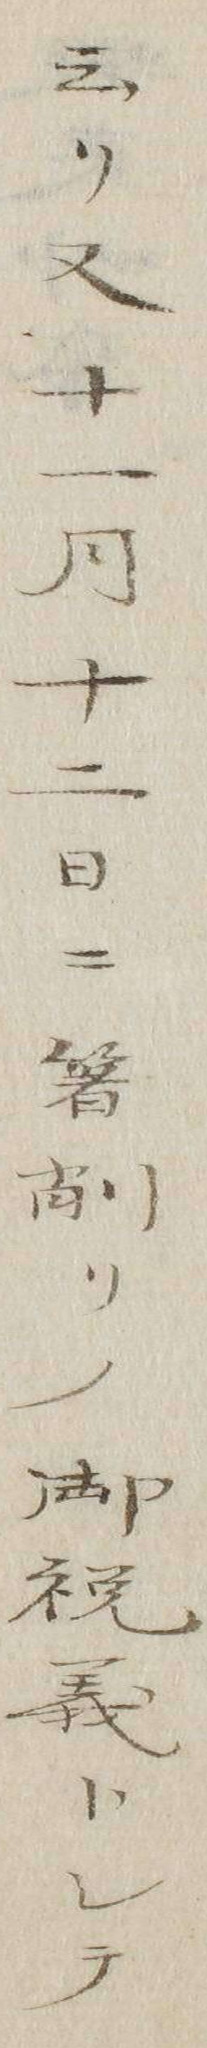云リ又十一月十二日ニ箸削リノ御祝義トシテ
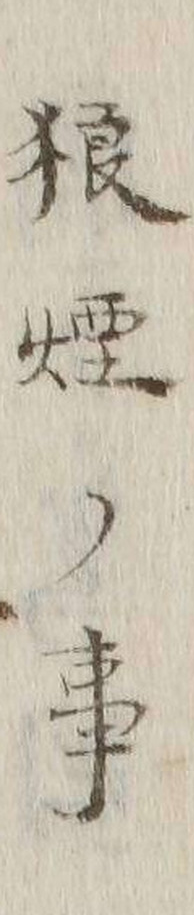狼煙ノ事
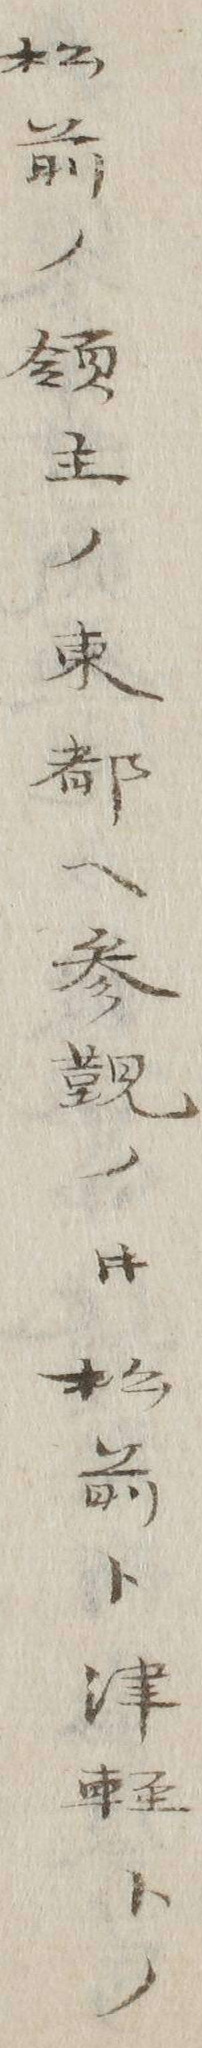松前ノ領主ノ東都ヘ参覲ノトキ松前ト津軽トノ
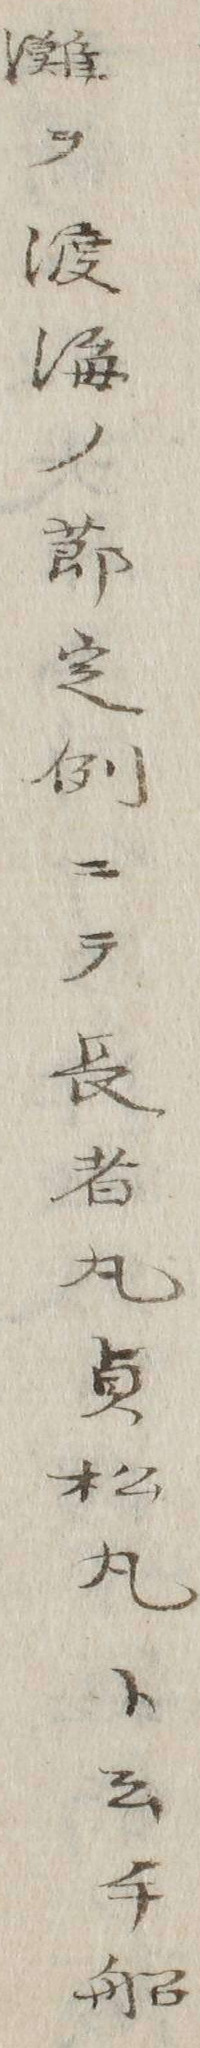灘ヲ渡海ノ節定例ニテ長者丸貞松丸ト云手船
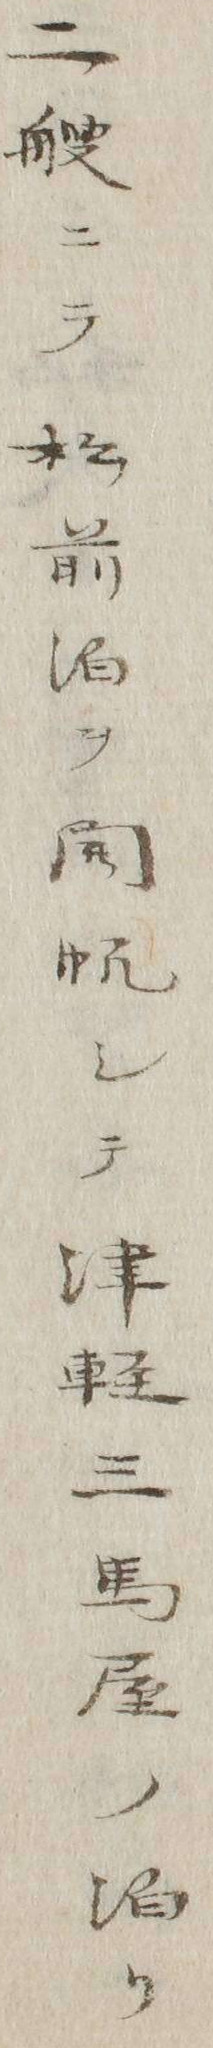二艘ニテ松前泊ヲ開帆シテ津軽三馬屋ノ泊リ
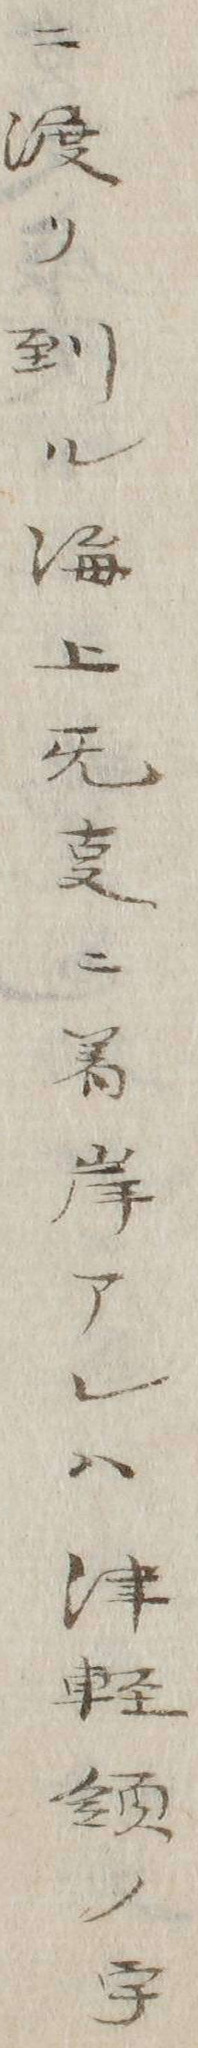ニ渡リ到ル海上無事ニ着岸アレハ津軽領ノ宇
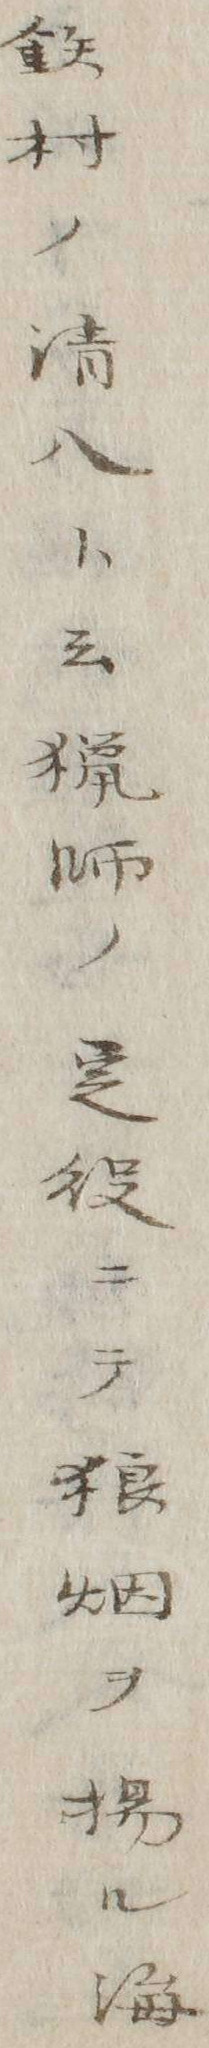鉄村ノ清八ト云猟師ノ定役ニテ狼煙ヲ揚ル海
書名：蝦夷草紙（国文学研究資料館）
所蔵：国文学研究資料館
